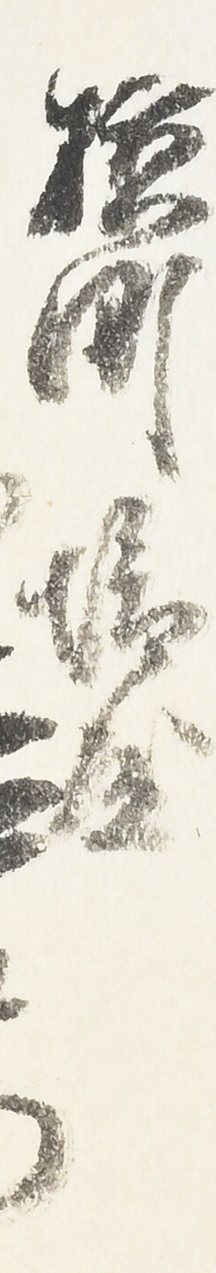横町塩屋
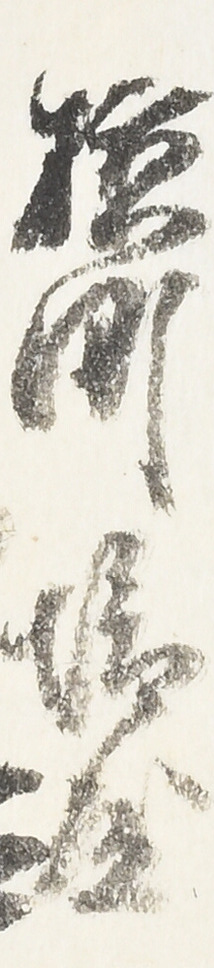横町塩屋
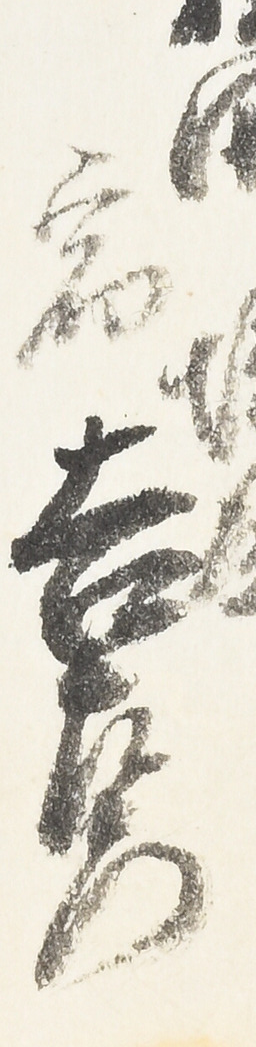宿吉左衛門
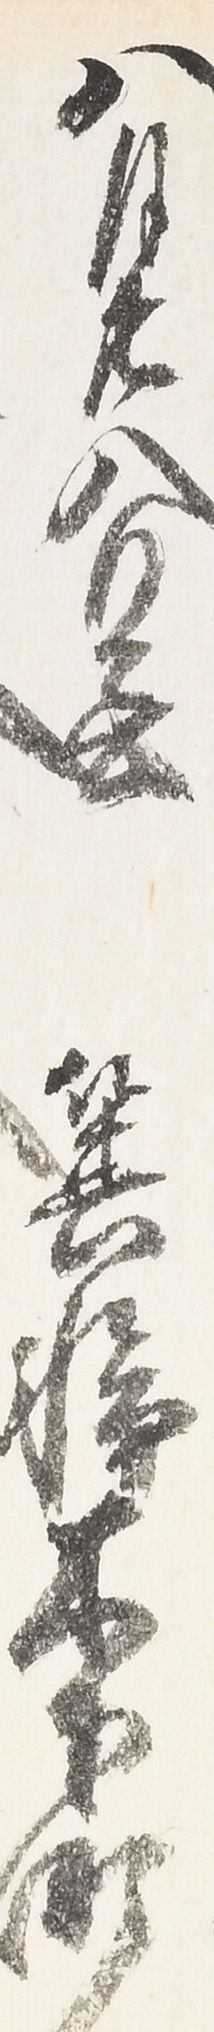八月廿八日着箕輪木下町
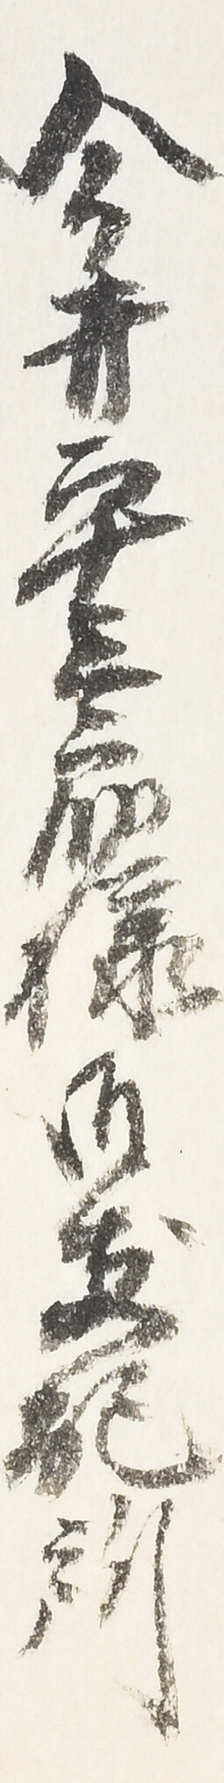今井平三郎様御支配所
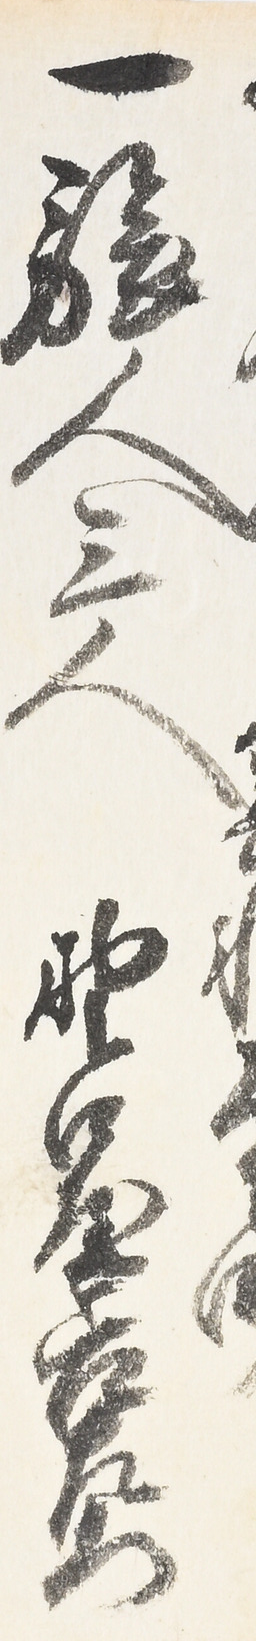一旅人三人野口屋善左衛門
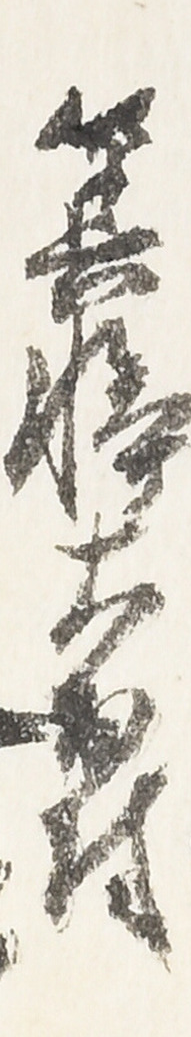箕輪大出村
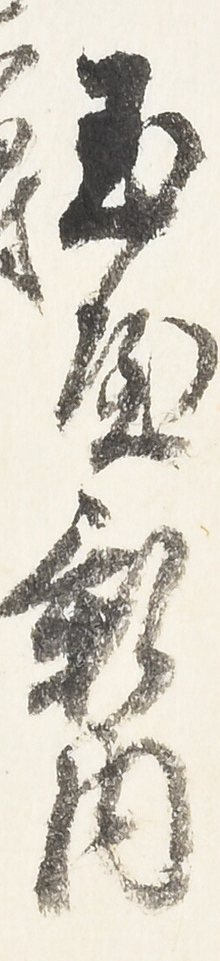玉屋新内
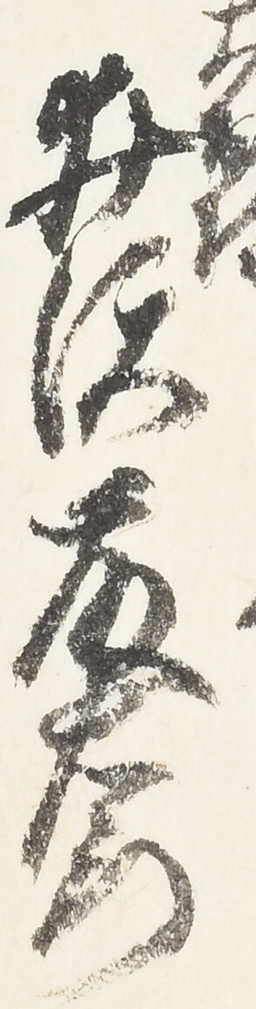井沢籐右衛門
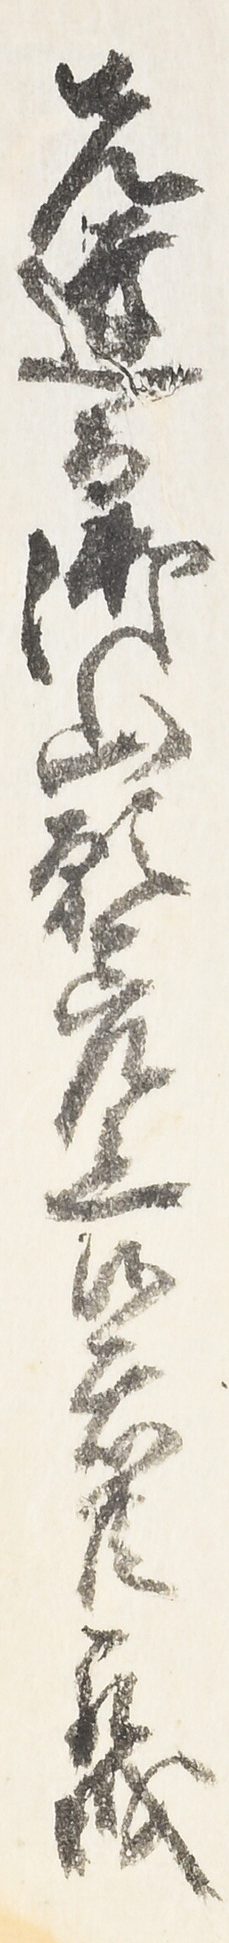先達而御山願差上候者共罷越
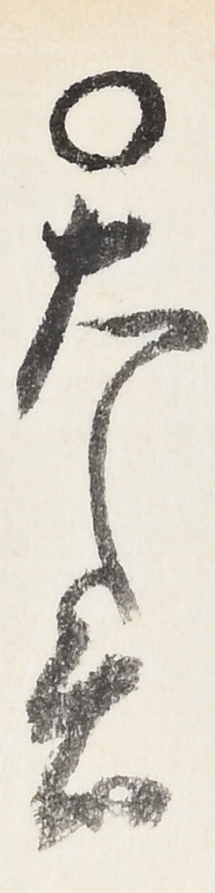〇右之者
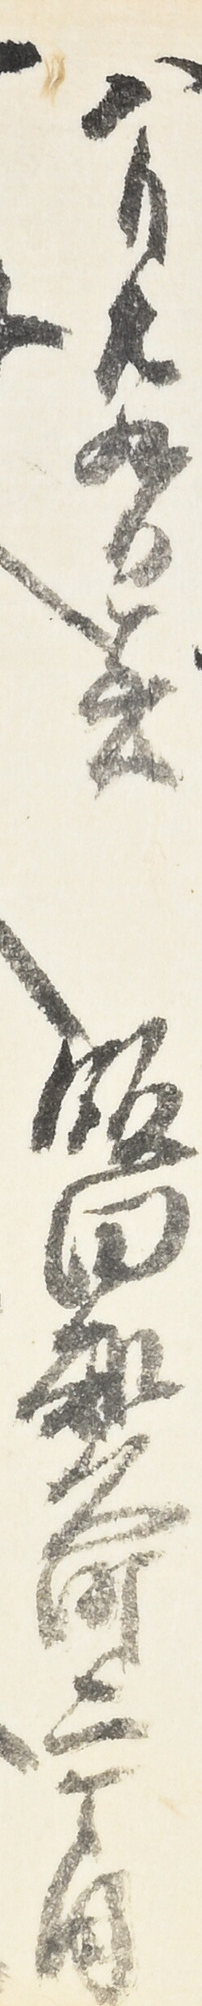八月廿九日着飯田知久町二丁目
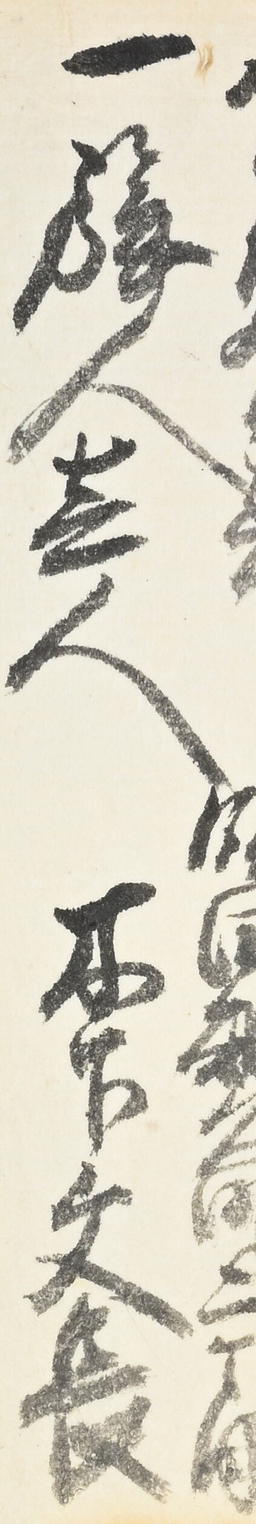一旅人壱人木下文長
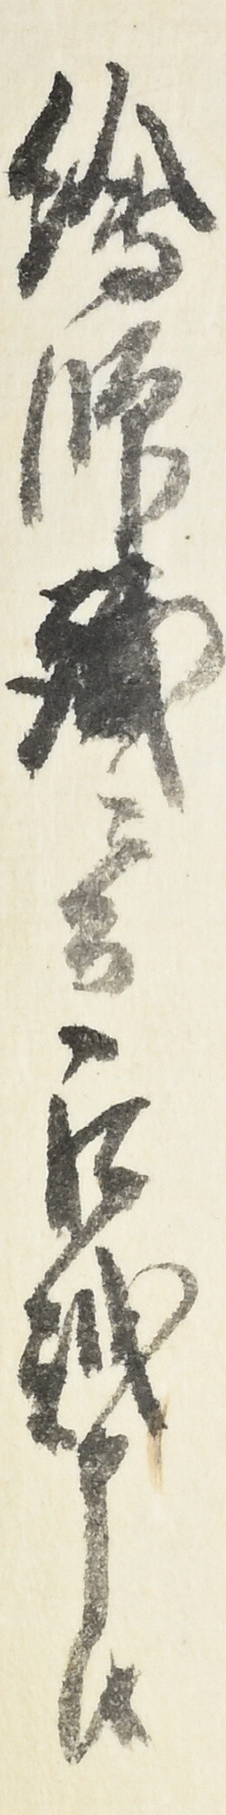絵師職ニ而罷越申候
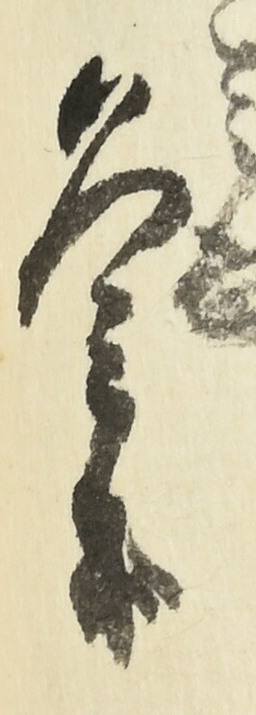久兵衛

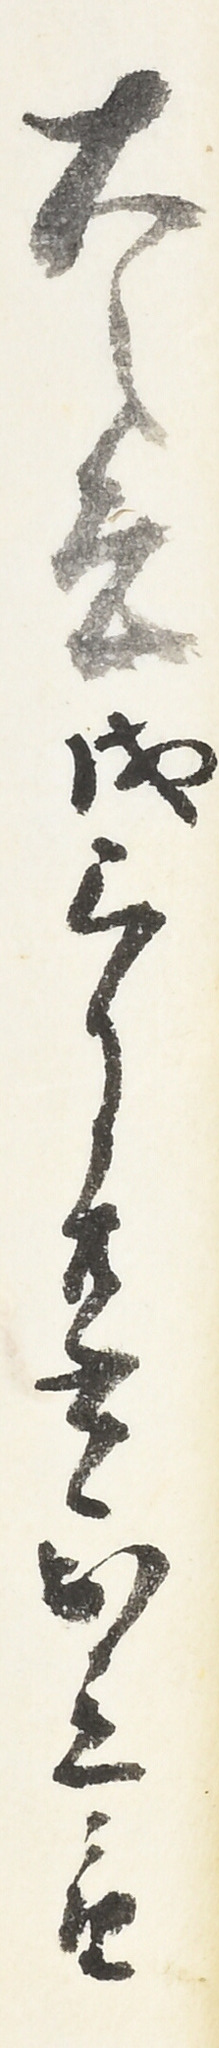右之者戌三月廿六日出立届
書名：町中旅人泊控帳
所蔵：伊那市立高遠町図書館・合同会社AMANE
